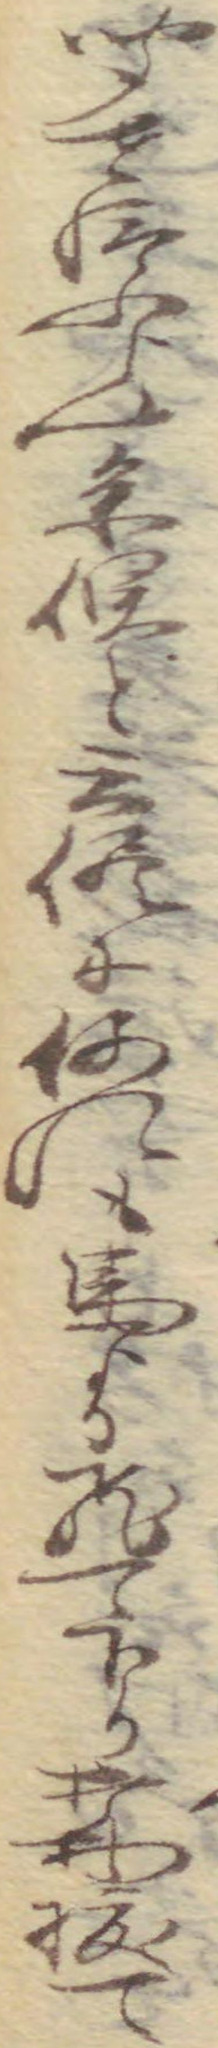聞せ給ふらん参候と云侭に何れも馬より飛て下り打物抜て
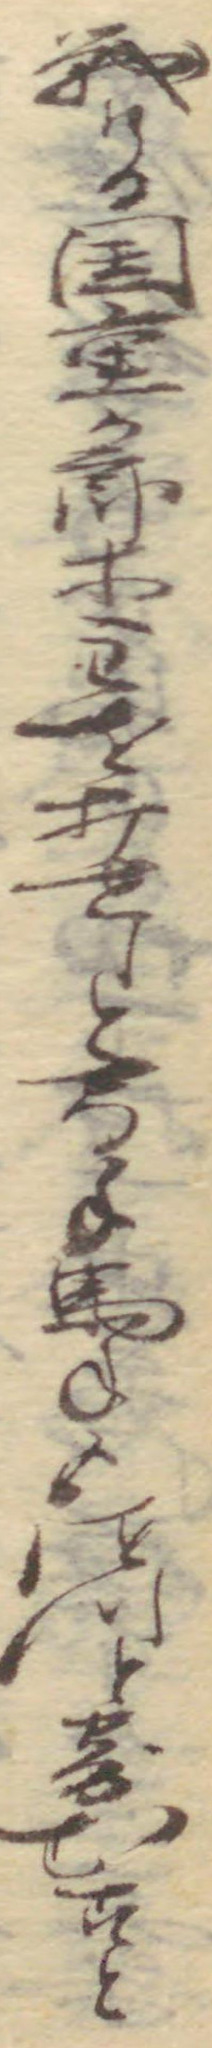戦ける国重か郎等主を打せしと弓手馬手ゟつつと寄むすと
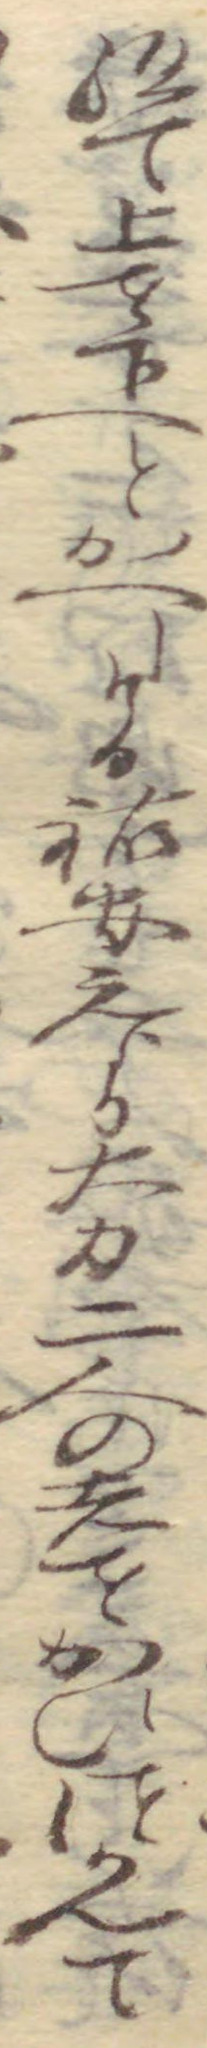組て上を下へとかへしける祐安元より大力二人の者をかひつかんて
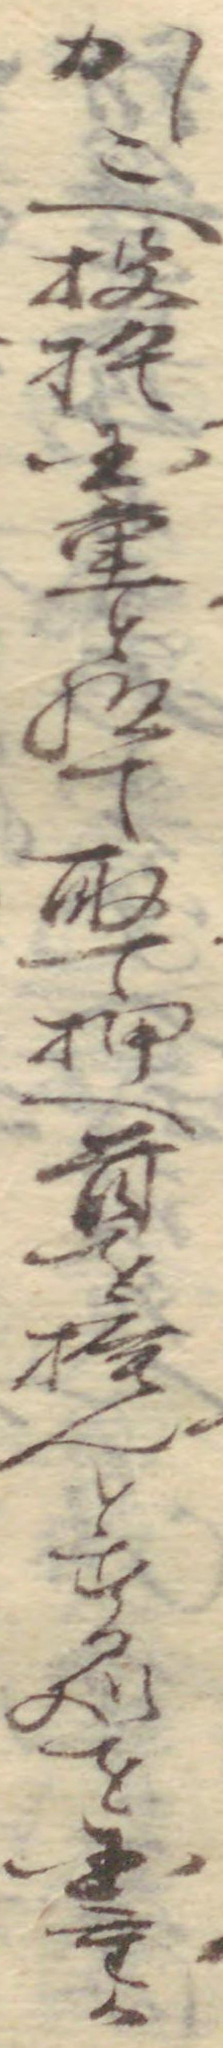かしこへ投捨国重と組て取て押へ首を掻んとする処を国重か
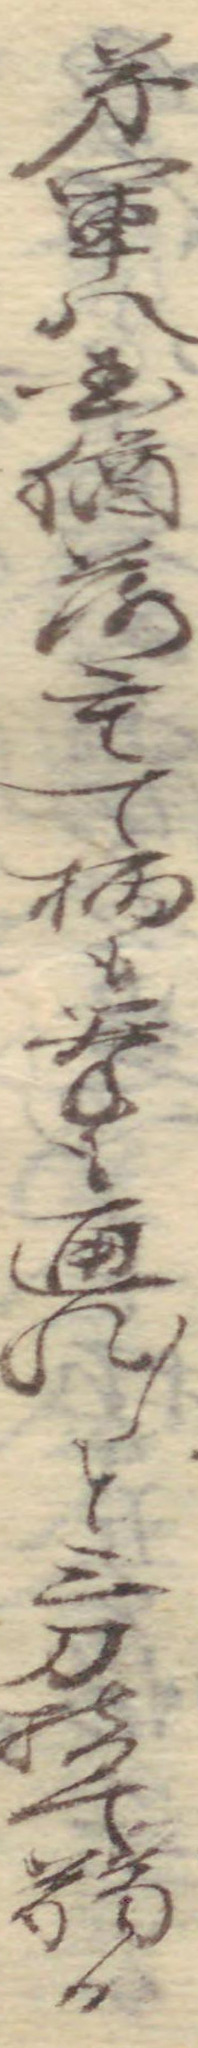弟軍八国猶落重て柄も挙も通れ〳〵と三刀指て弱る
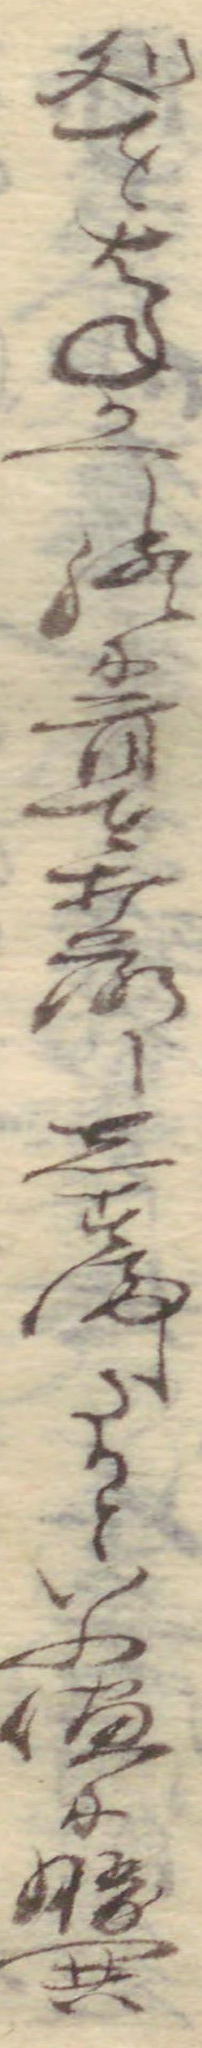処をはねかへし終に首を打落ししすましたりといふ儘に勝鬨
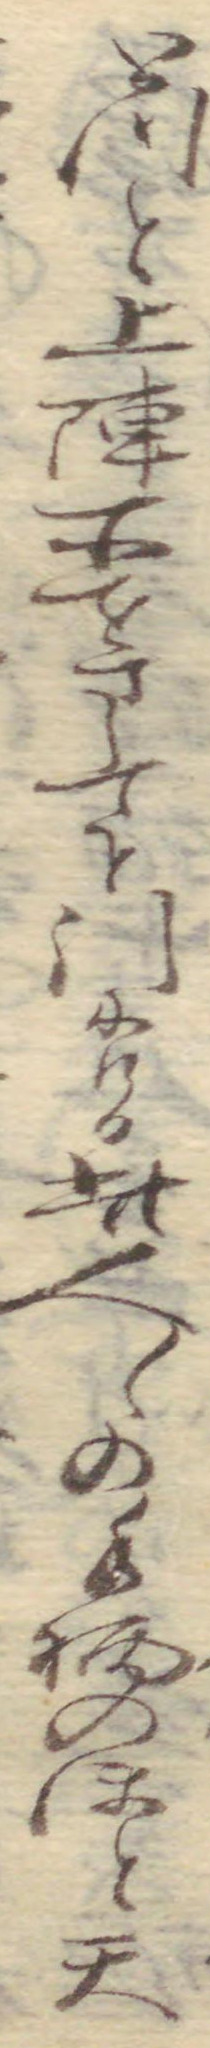とつと上陣所をさしてそ引にける此人々の手柄のほと天
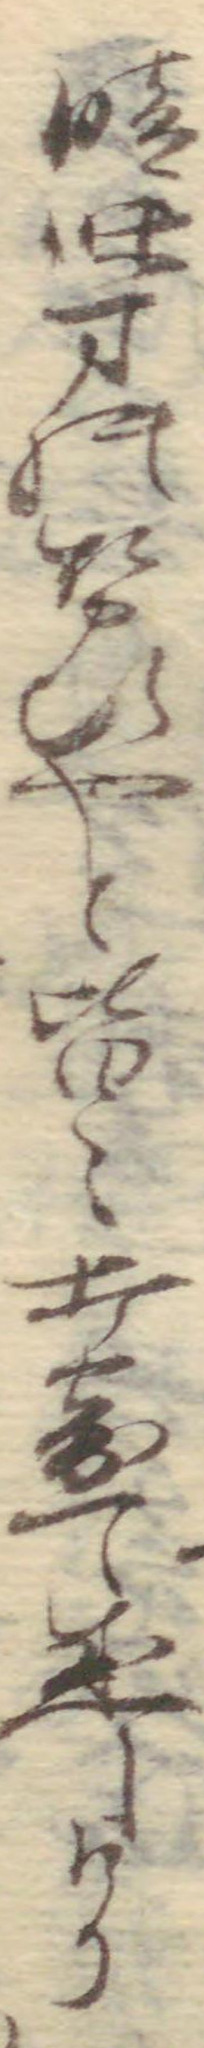晴味方の勢ひやと皆々打寄て盛しけり
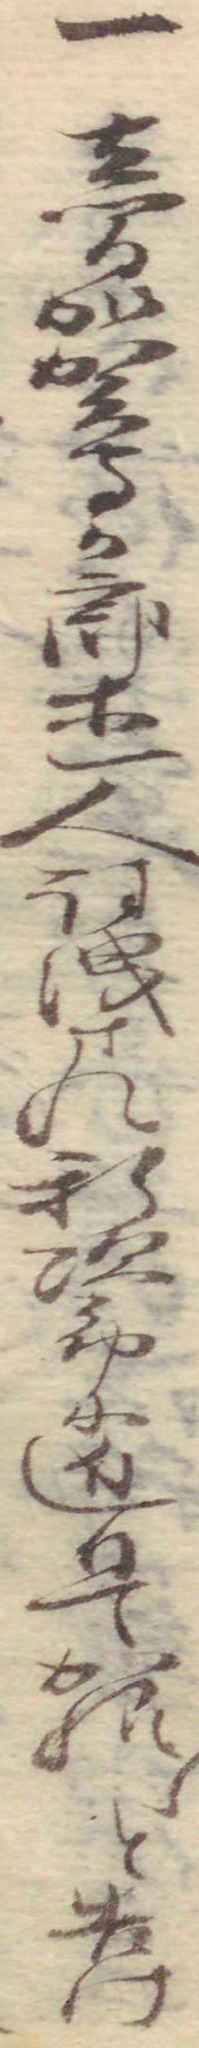一去間加賀守か郎等一人討洩され新次郎に近付てか様〳〵と告け
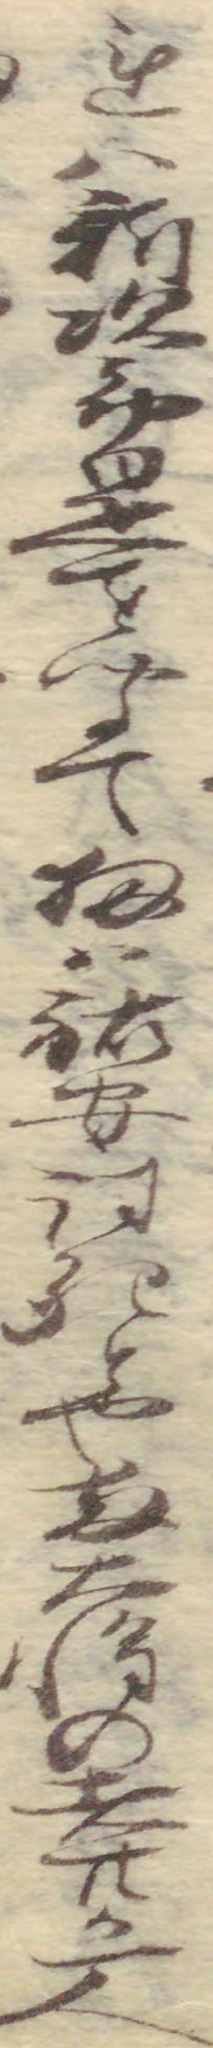れは新次郎是を聞て扨は祐安討死とや両大将の者共か一人
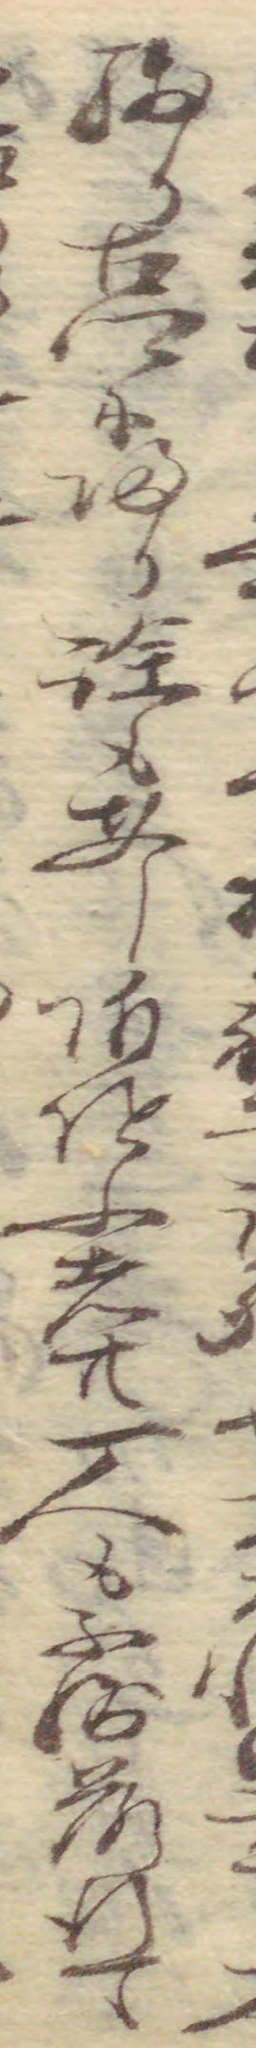残り古郷に帰り詮もなし附隨ふ者共一人も不残落行て
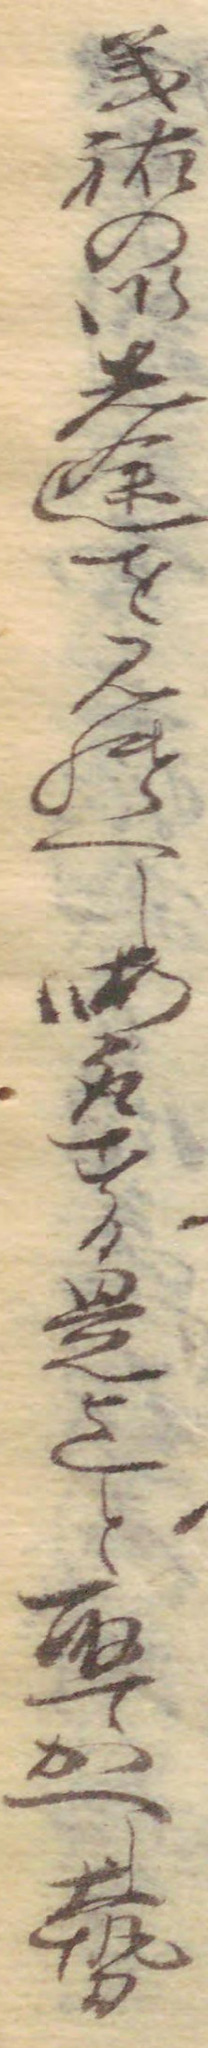義祐の御先途を見継へし暇取する是迄と取てかへし大勢

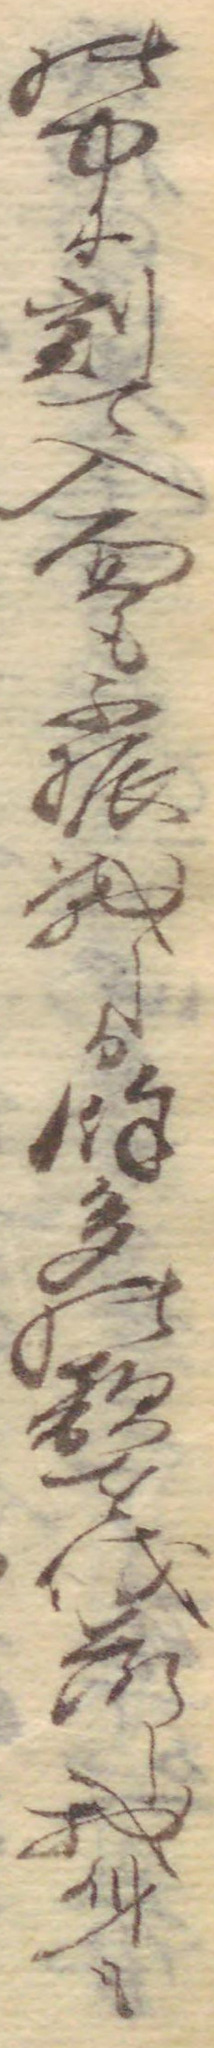の中に割て入面も不振戦しか余多の敵を伐落し我身も
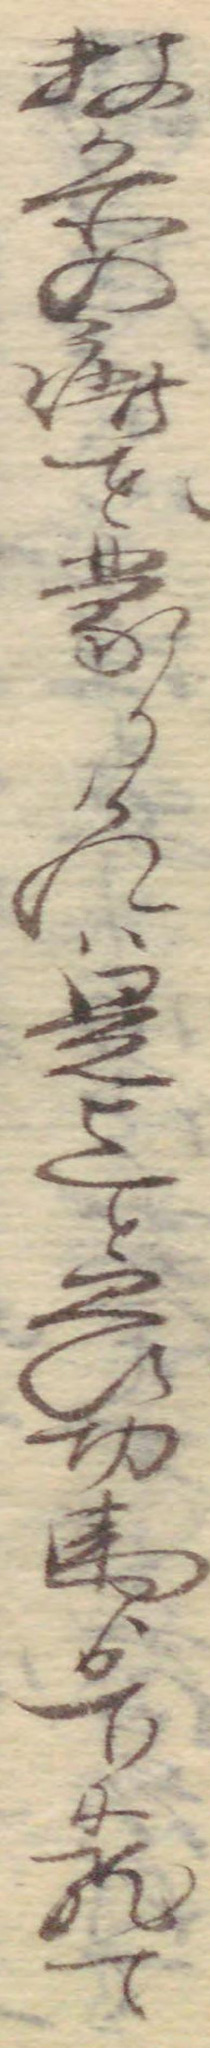数か所の疵を蒙りけれは是迄と思ひ切馬ゟ下に飛て
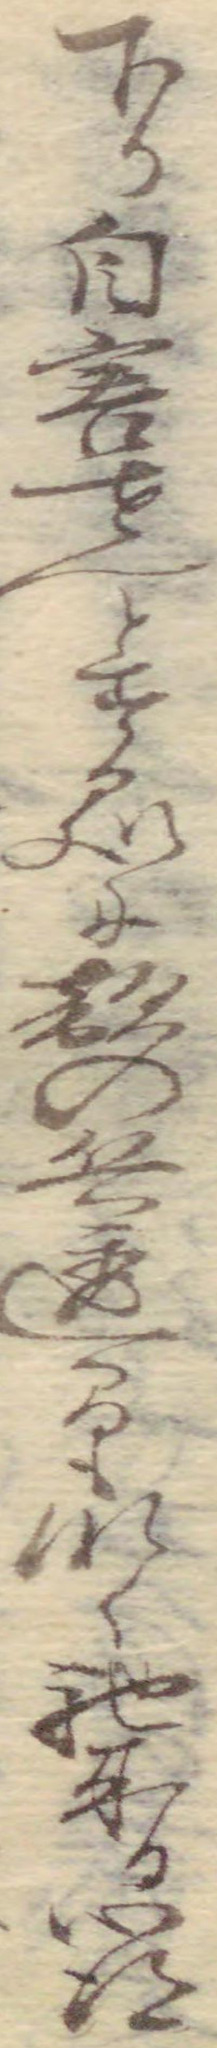下り自害せんとする処に敵の兵透間もなく馳来る心得
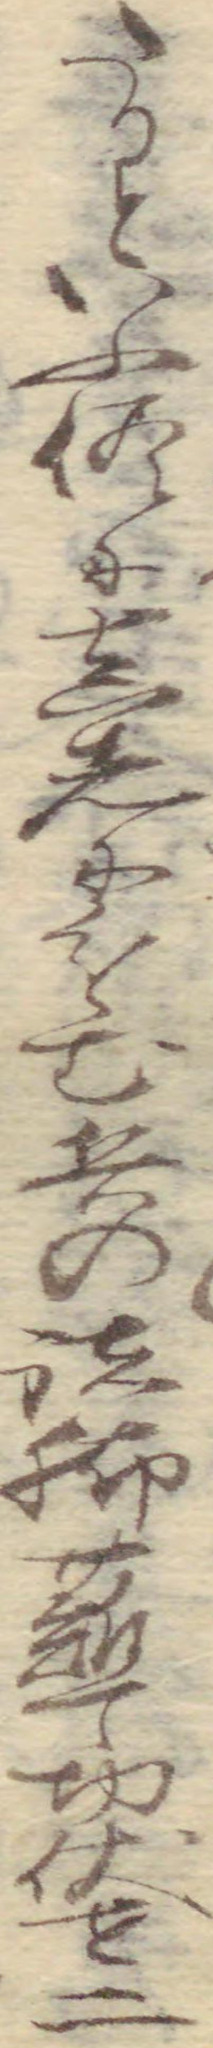たりといふ儘に真先に進む兵の諸脚薙て切伏せ二
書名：鶯宿雑記. 巻199-200
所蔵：国立国会図書館 National Diet Library, JAPAN
